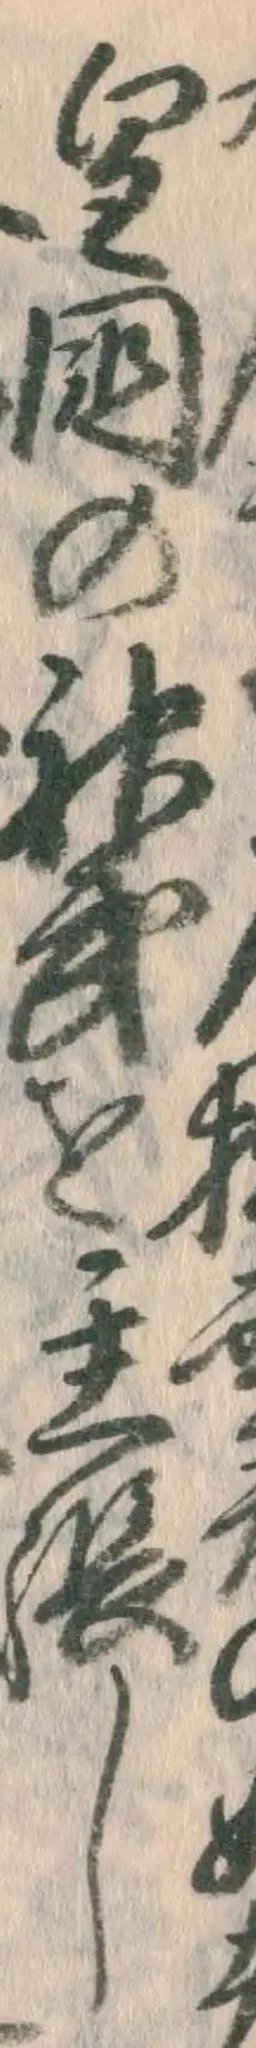皇国の神武を主張し
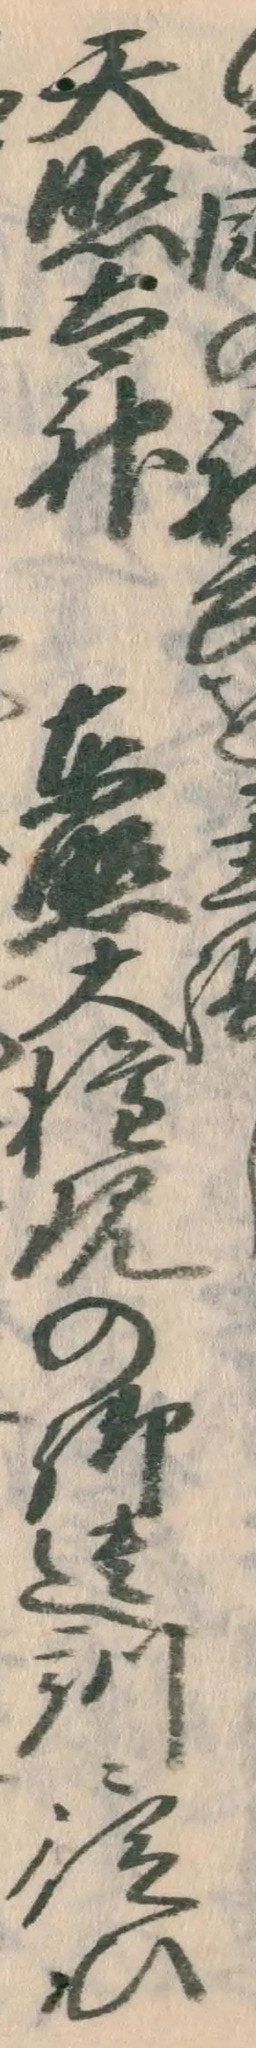天照太神東照大権現の御遺訓ニ従ひ
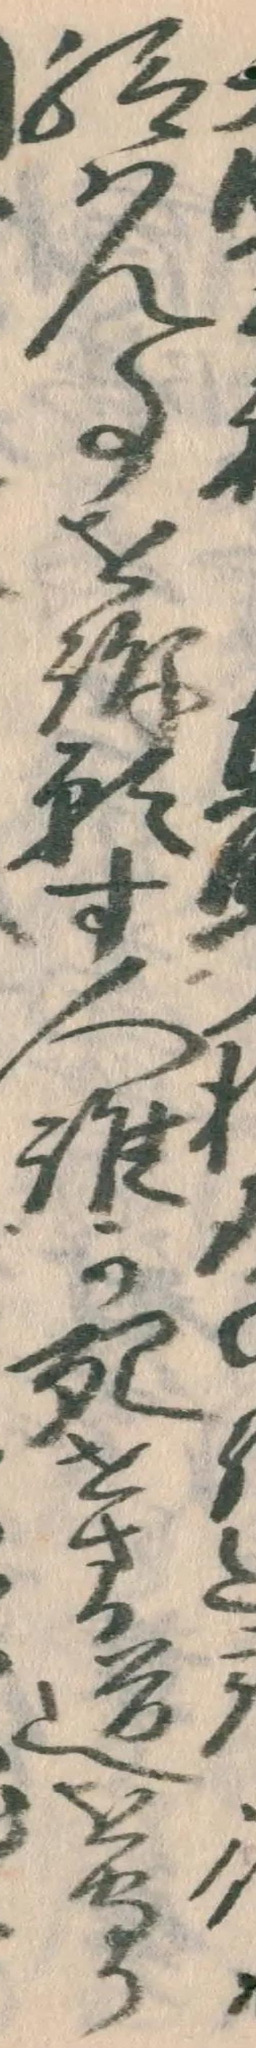給ハん事を訴願す人誰か死せさる道を守り
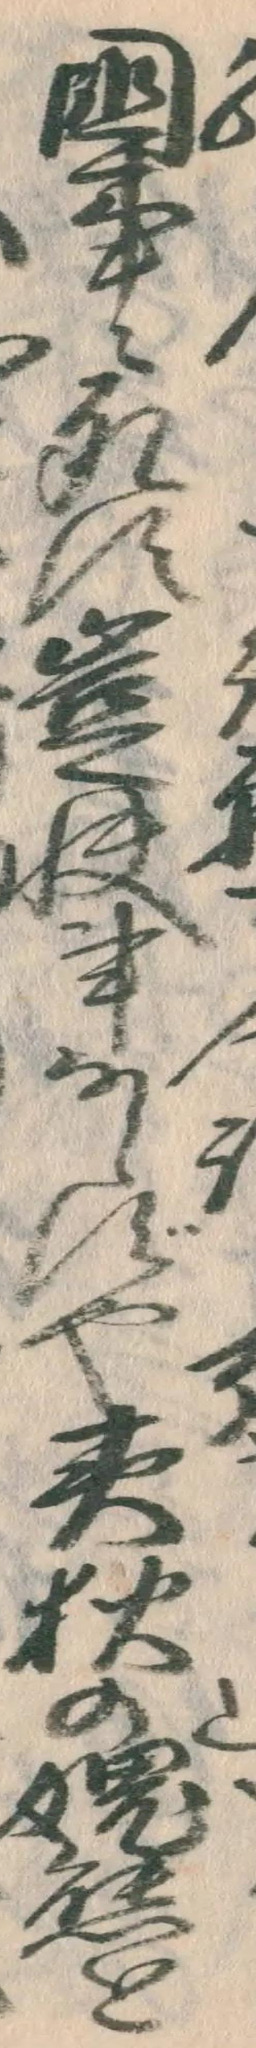國事ニ死す豈快事ならずや夷狄の媿態を
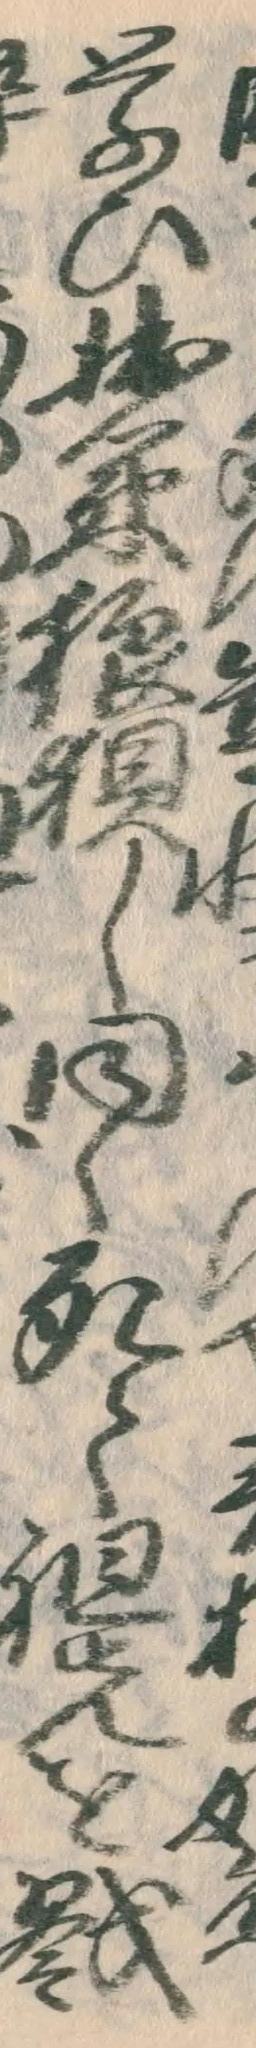学ひ拙策狼狽し同く死て祖先を戮
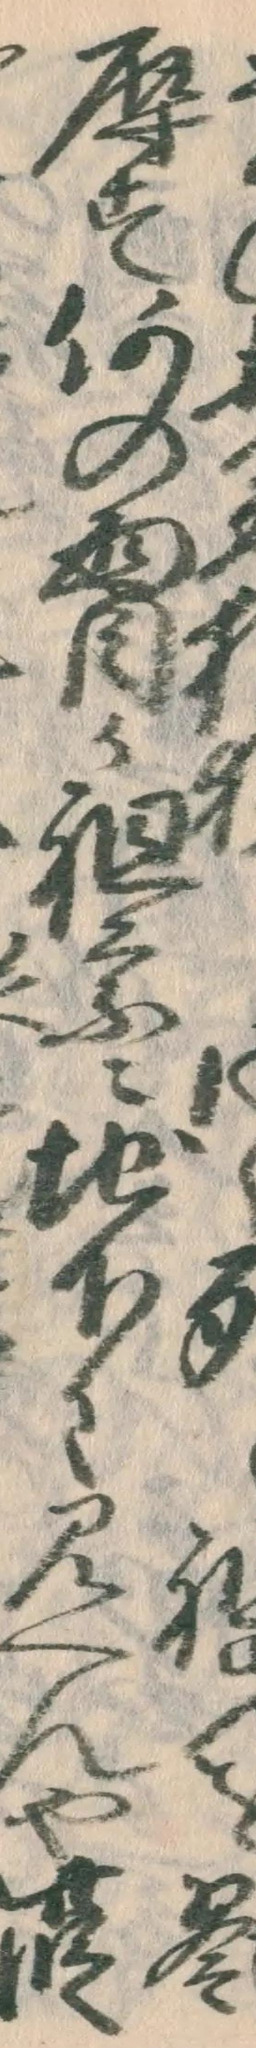辱す何の面目か祖宗ニ地下に見へんや此段
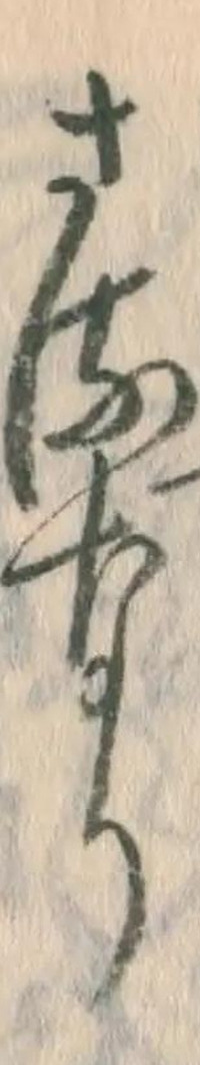さるなり
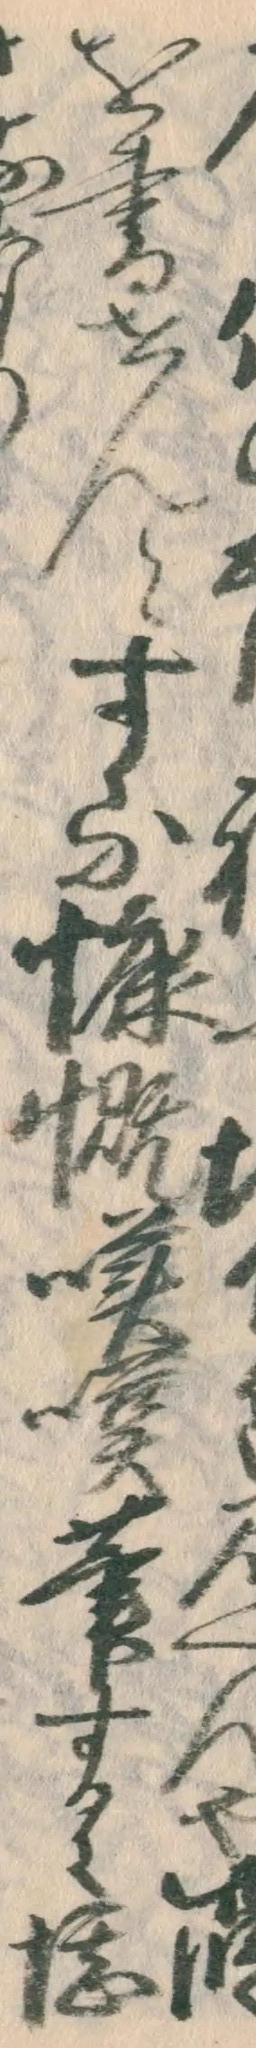を書せんとする慷慨嘆嘆筆するに堪
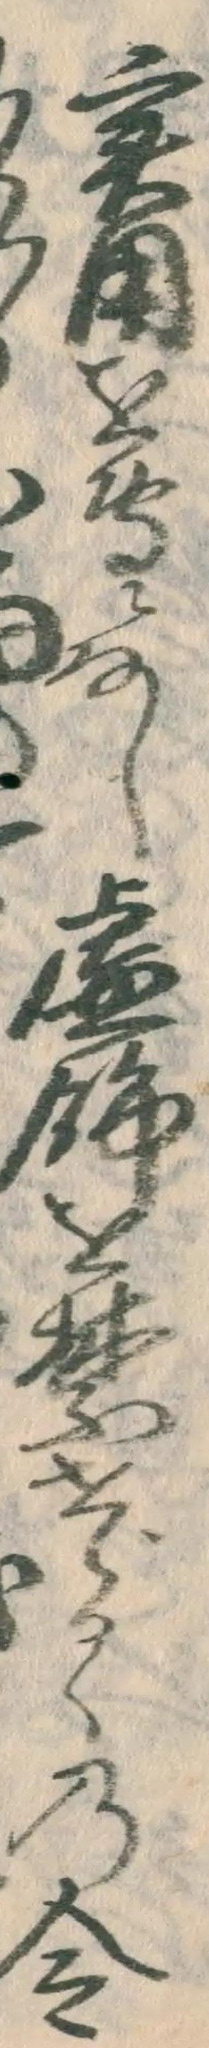実用を専ニなし虚飾を禁せらるゝの令
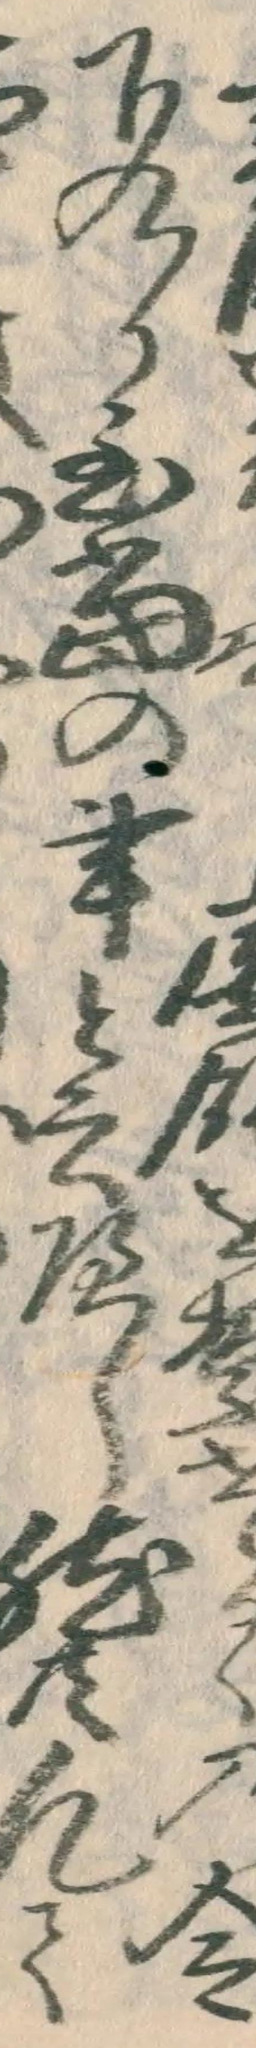下れり至當の事と云へし然共凡て
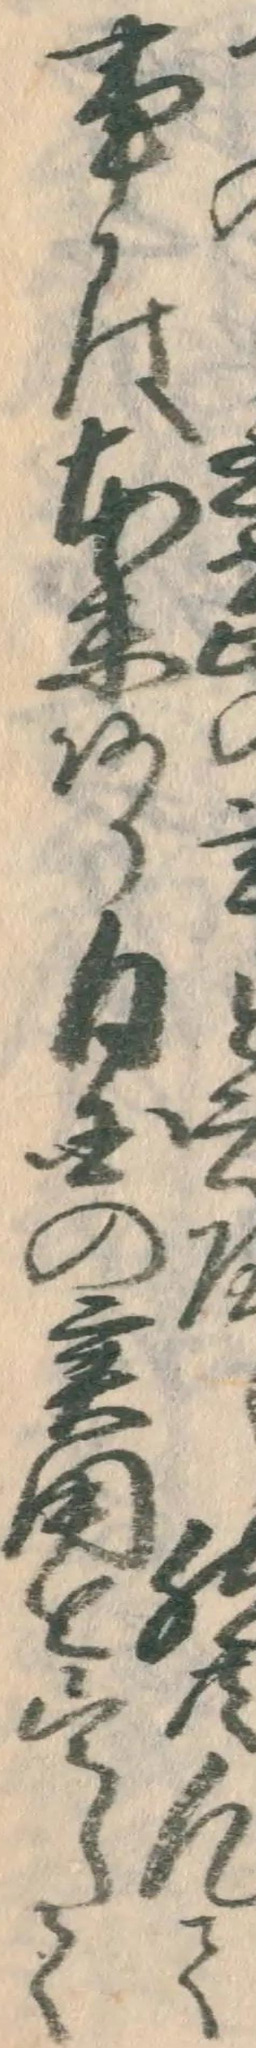事には本末あり自国の実用を尽して

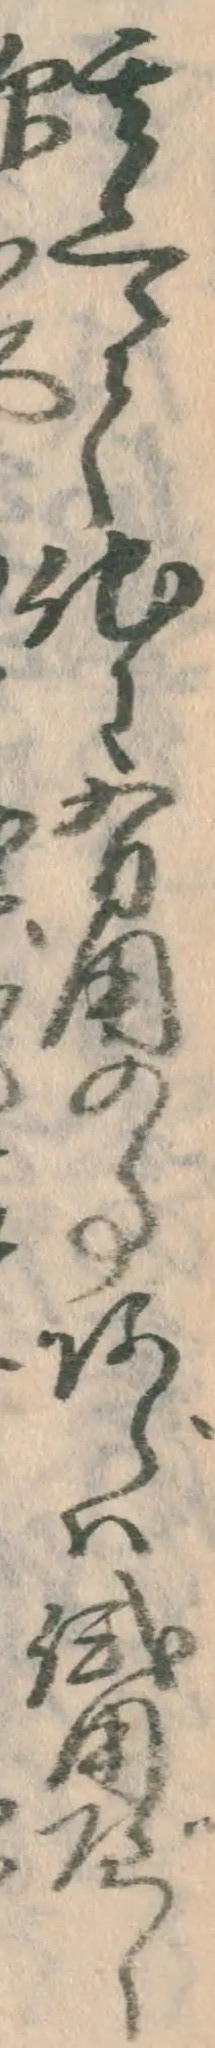其上ニて他に有用の事あらハ試用べし
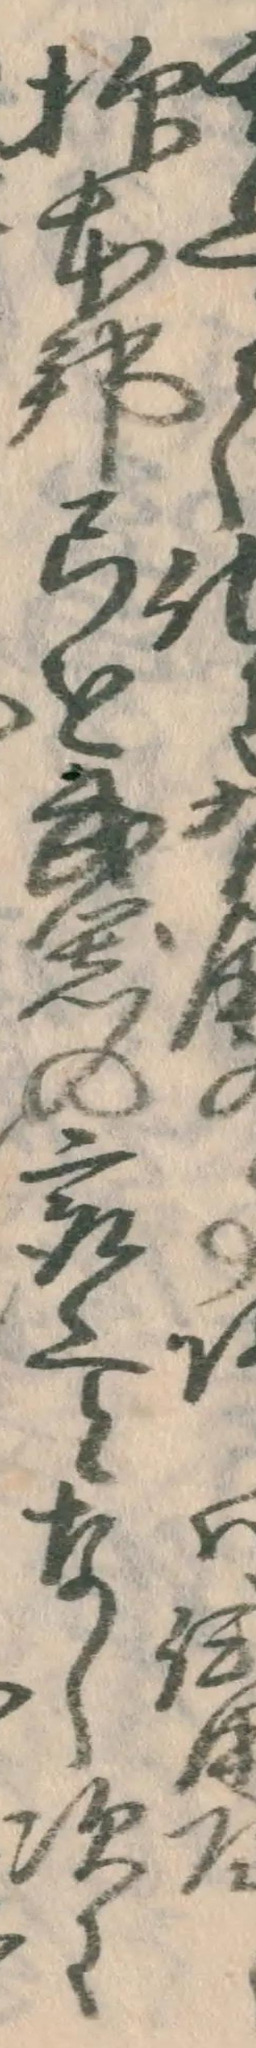抑本邦弓を武器の最上となし次に
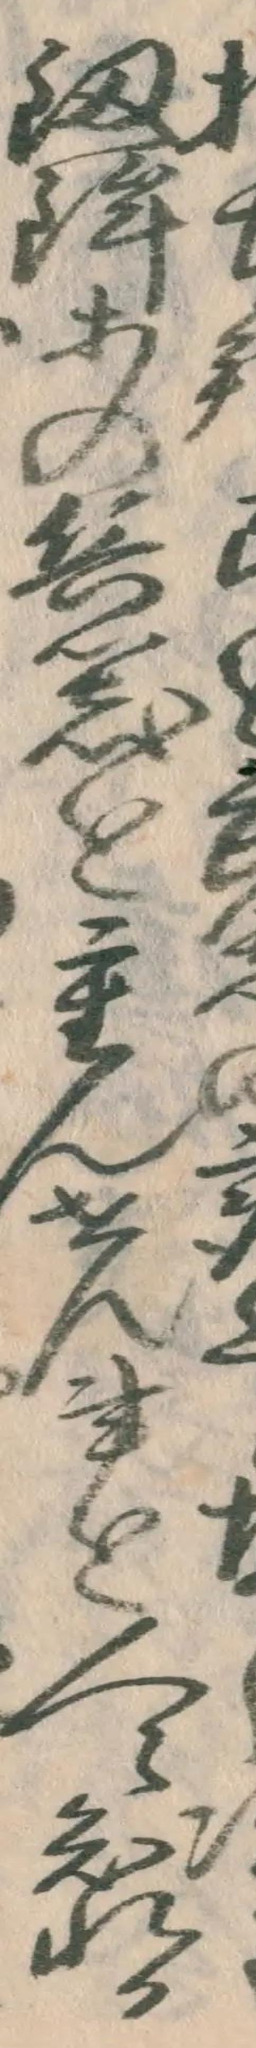剱鉾等の兵器を重んせん事を人々知れる
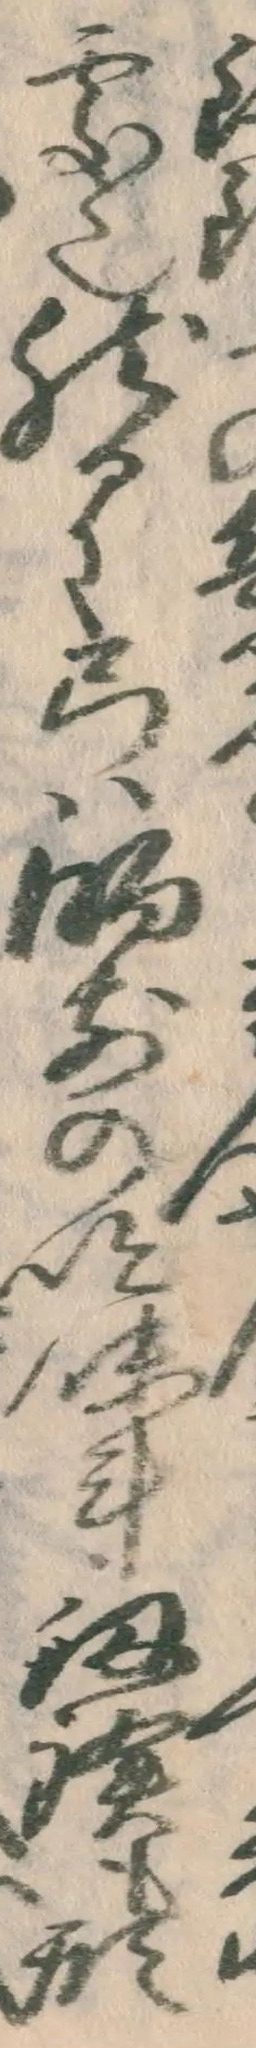處也然るに弓ハ的前の吟味斗剱鎗も形
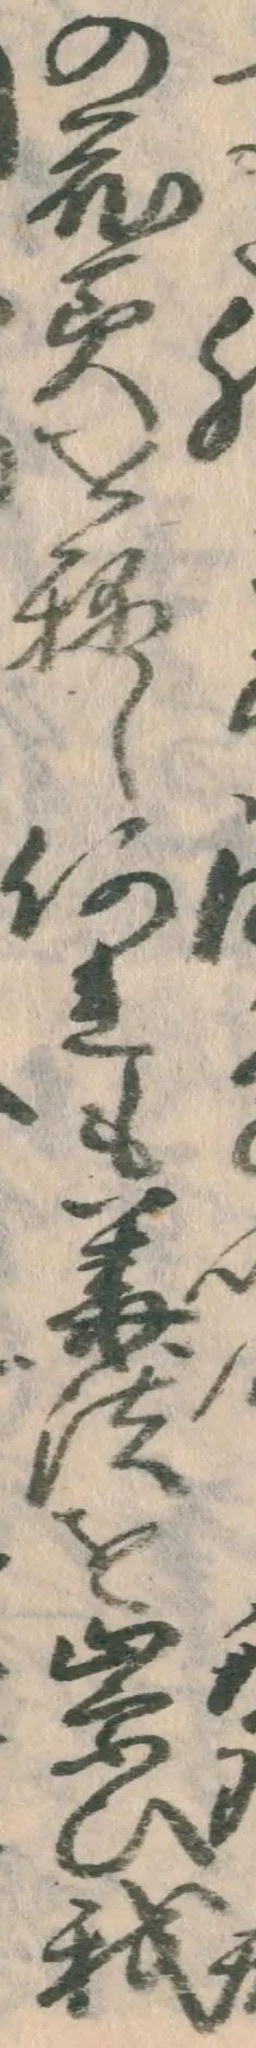の花美を称し何れも華法を崇ひ我
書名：麗斎叢書. 20
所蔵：国立国会図書館 National Diet Library, JAPAN
